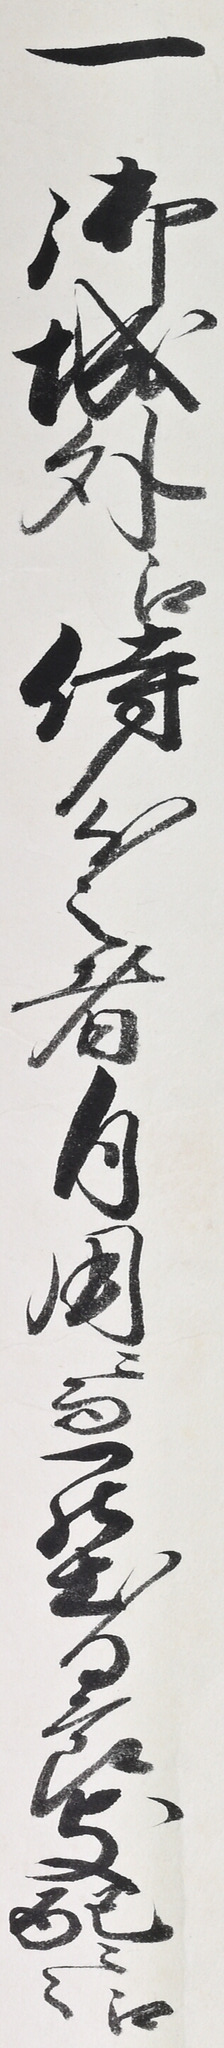一御城外江侍分之者自用ニ而罷出る節支配ゝゝ江
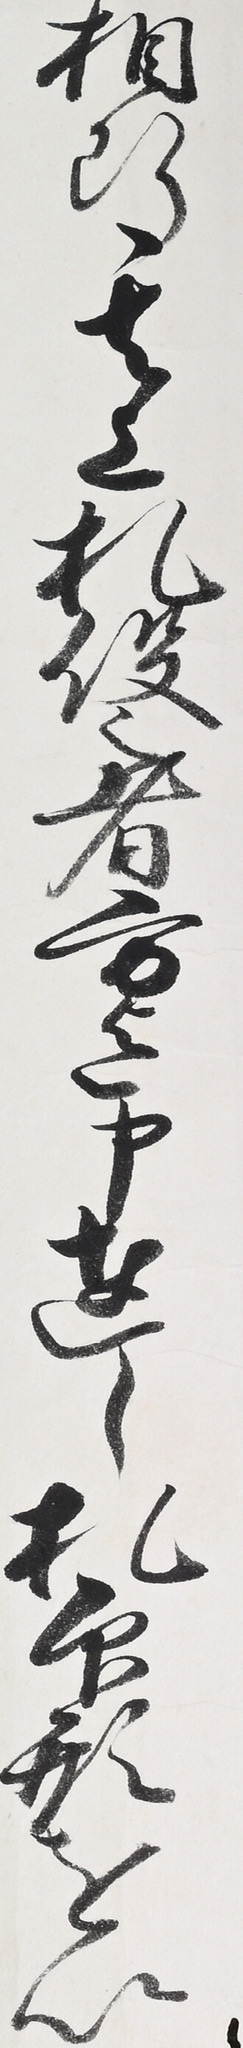相断其上札役之者方迄申達し札印形を以
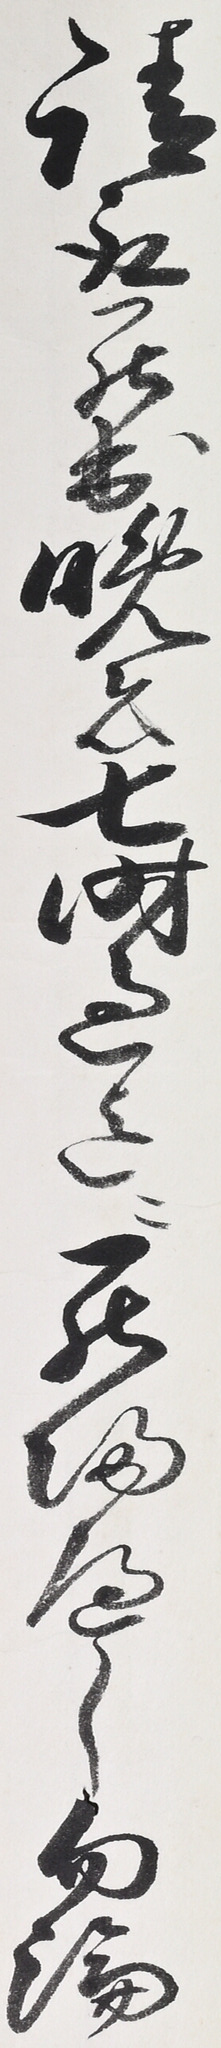請取罷出晩者七時過迄ニ罷帰へし勿論
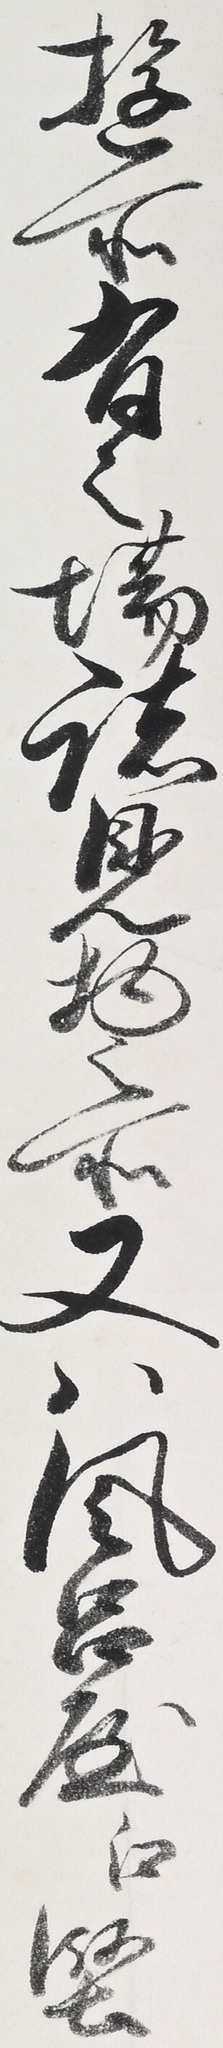遊所有之場諸見物之所又ハ風呂屋江堅
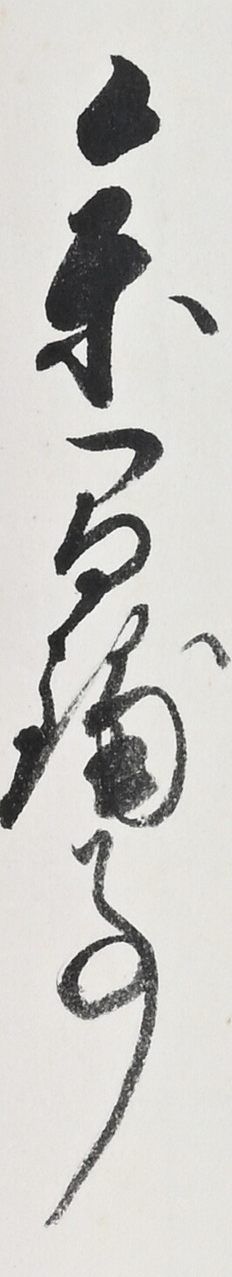参間鋪事
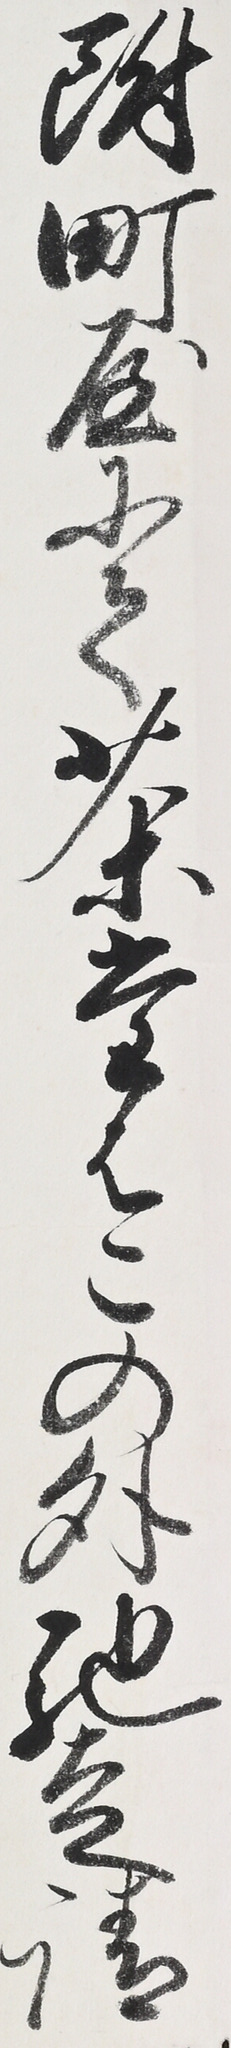附町屋にて茶たはこの外馳走請
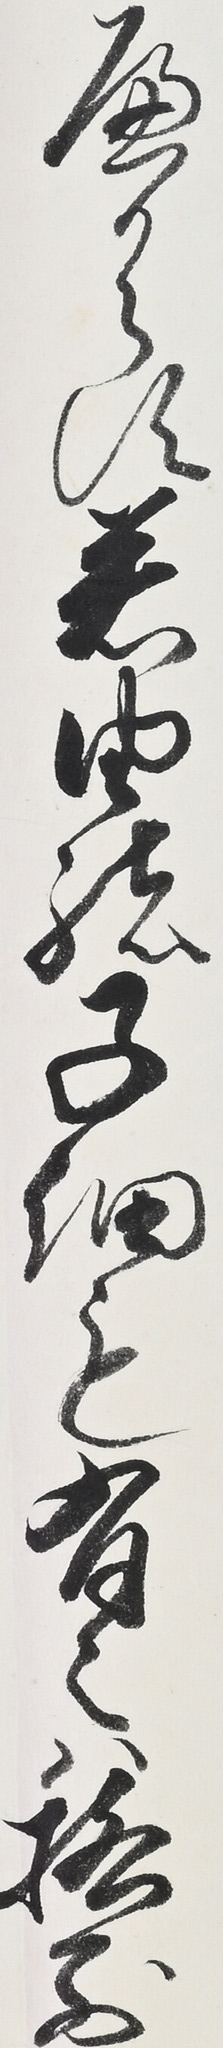へからす若由緒子細も有之格別
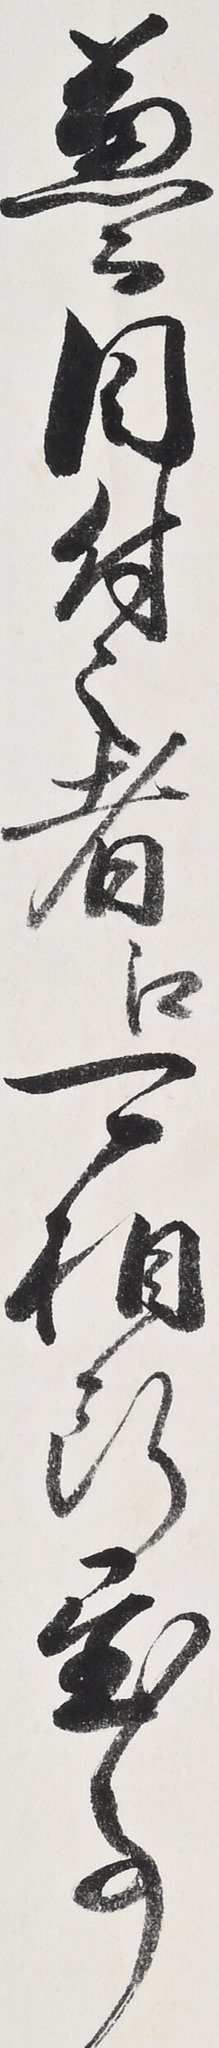兼而目付之者江可相断置事
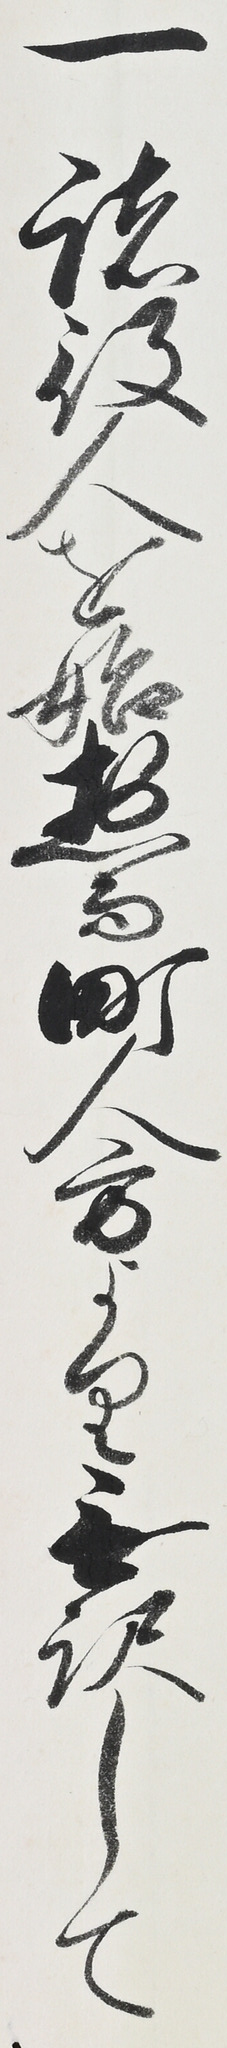一諸役人を始惣而町人方より無訳して
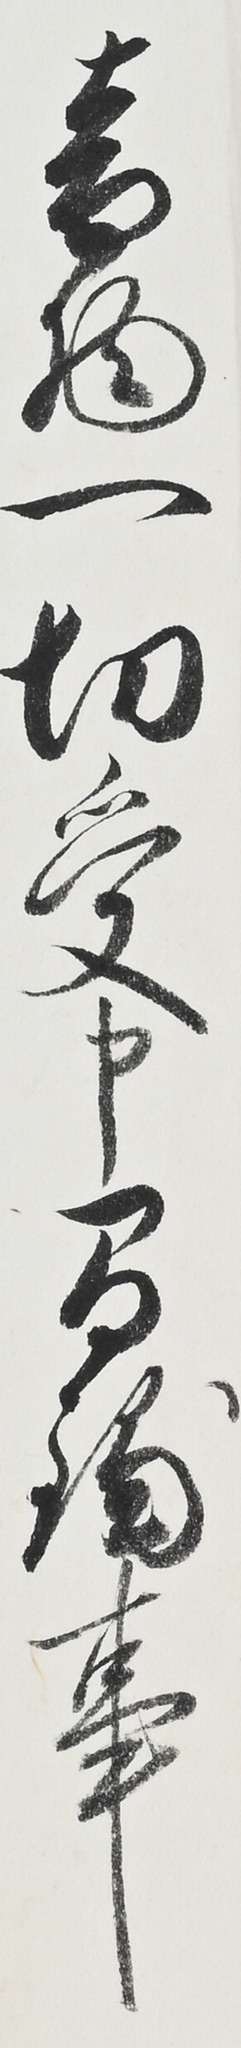音物一切受申間鋪事
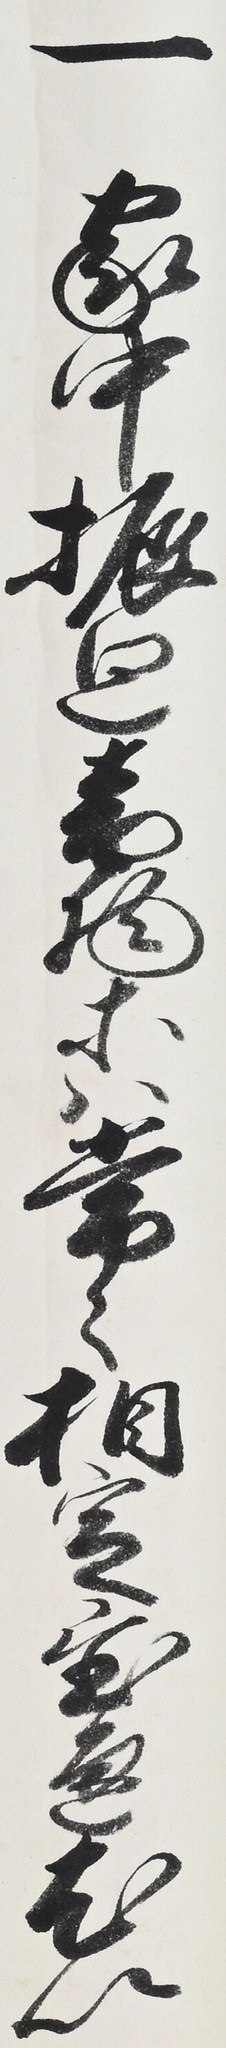一家中振廻音物等ハ常々相定置通尤以
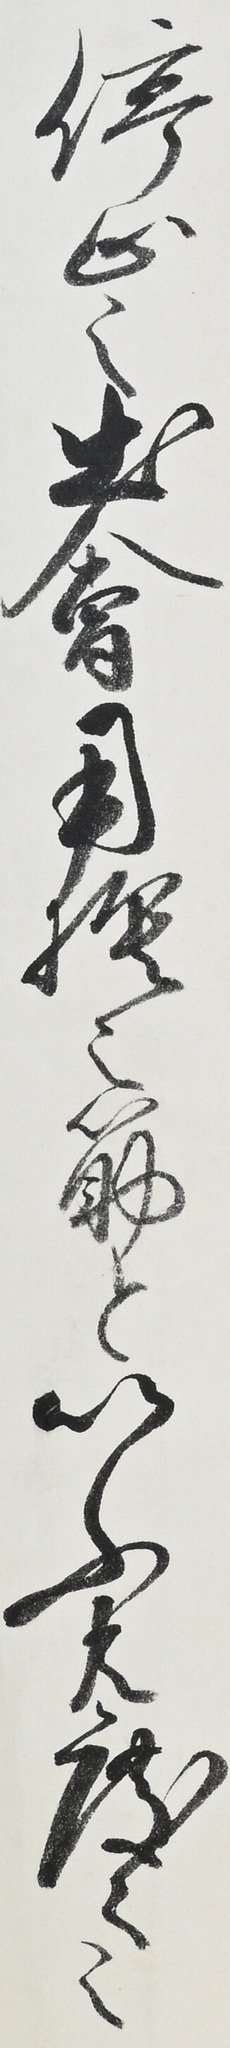停止之出会用捨之筋といふ共度々之

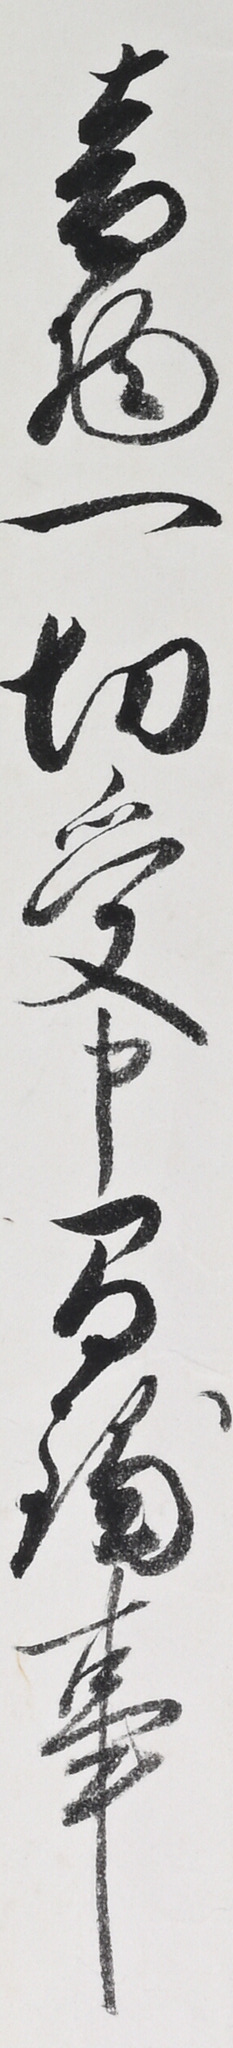音物一切受申間鋪事
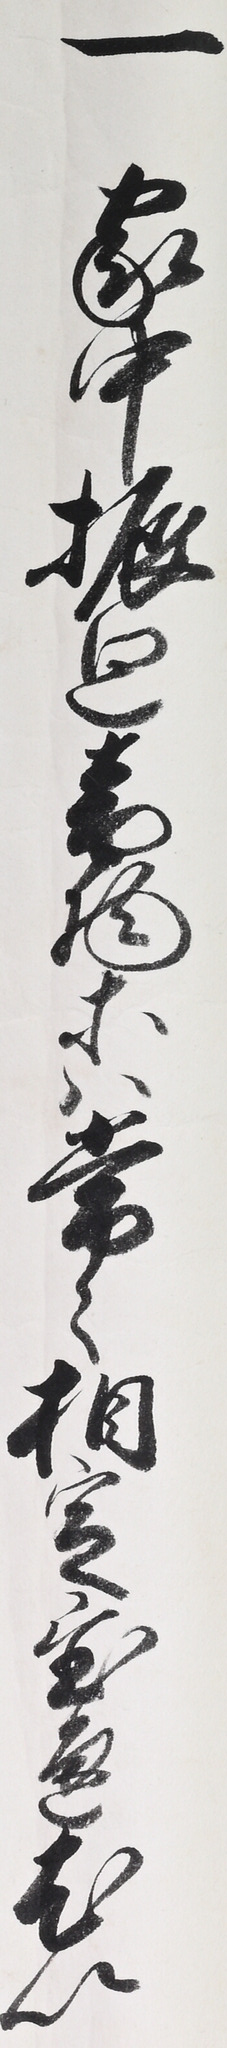一家中振廻音物等ハ常々相定置通尤以
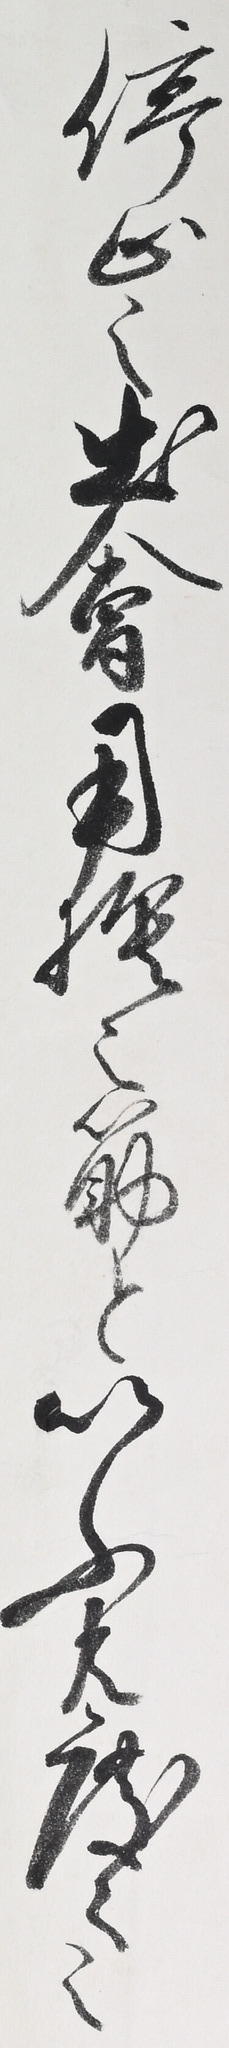停止之出会用捨之筋といふ共度々之
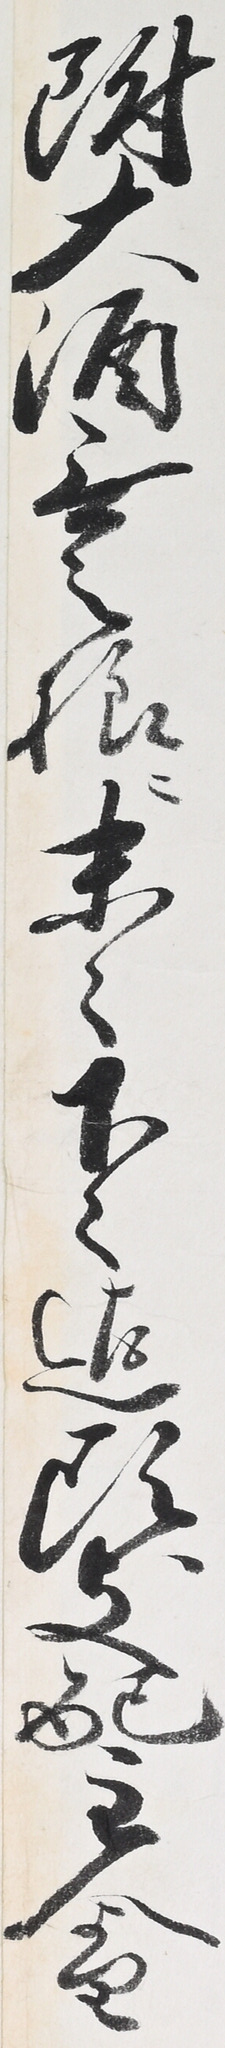附大酒無之様ニ末々下々迄頭支配主人より
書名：御条目
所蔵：伊那市立高遠町図書館・合同会社AMANE
